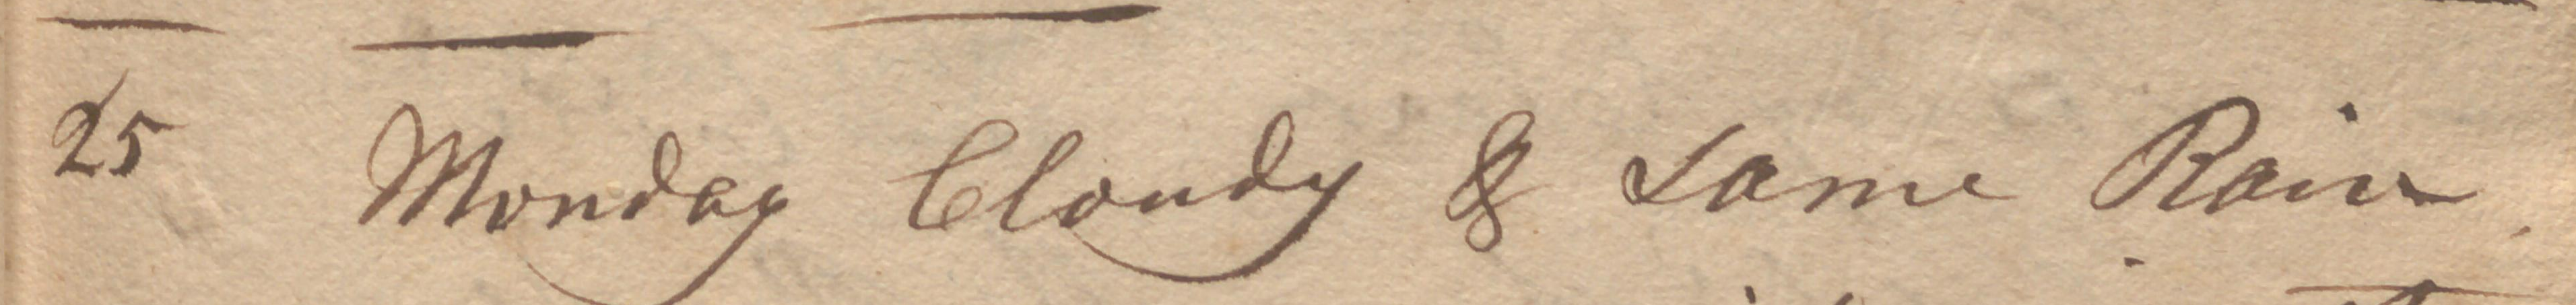25 Monday Cloudy & same Rain
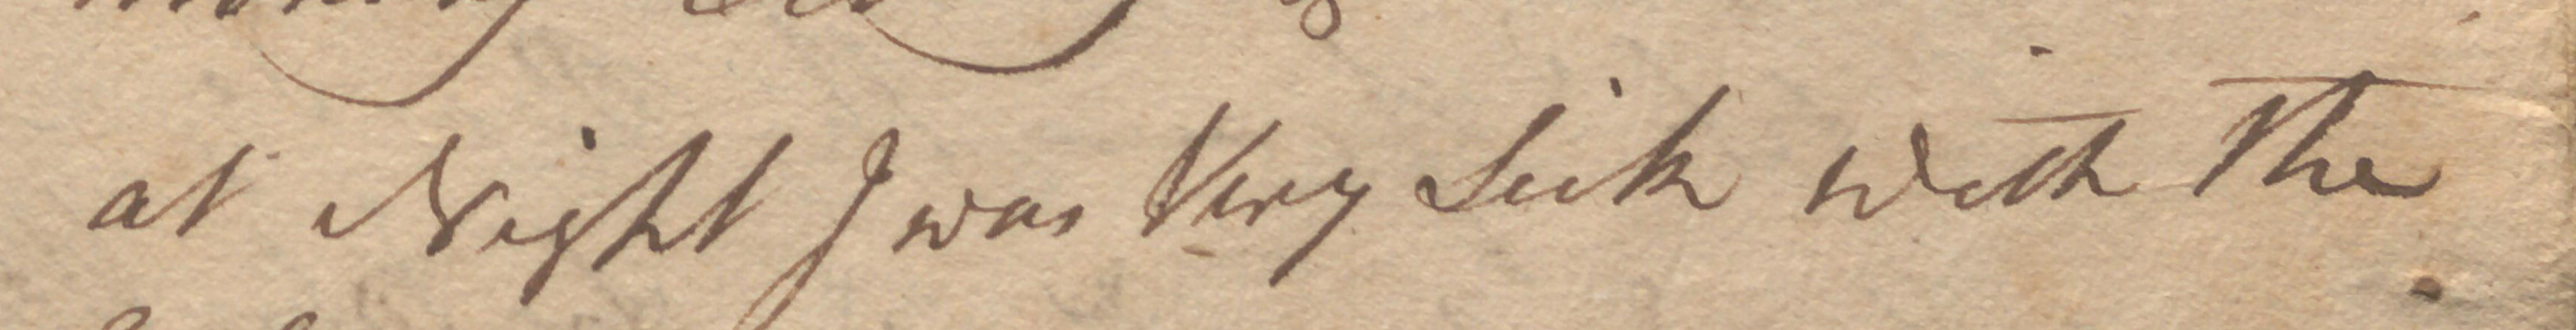at Night I was Very Sick with the
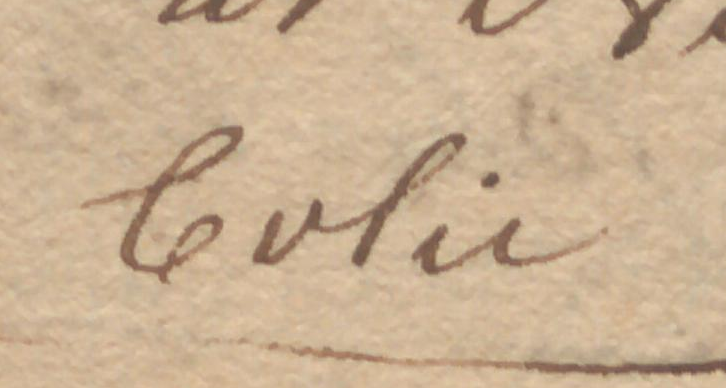Colic
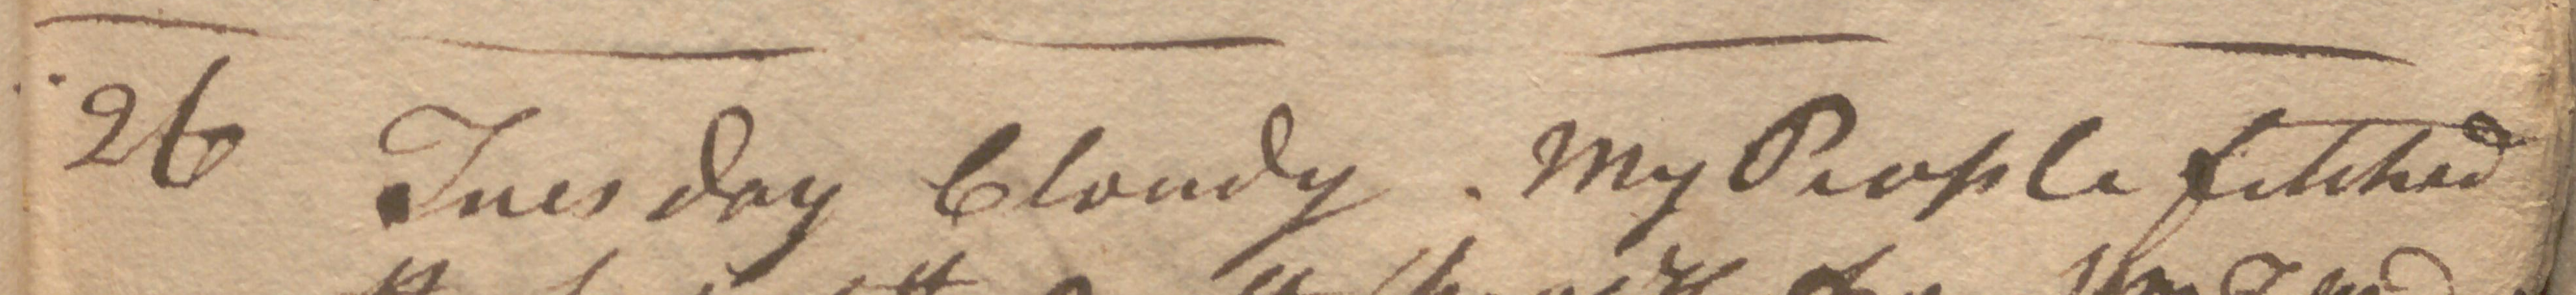26 Tuesday Cloudy My People fetched
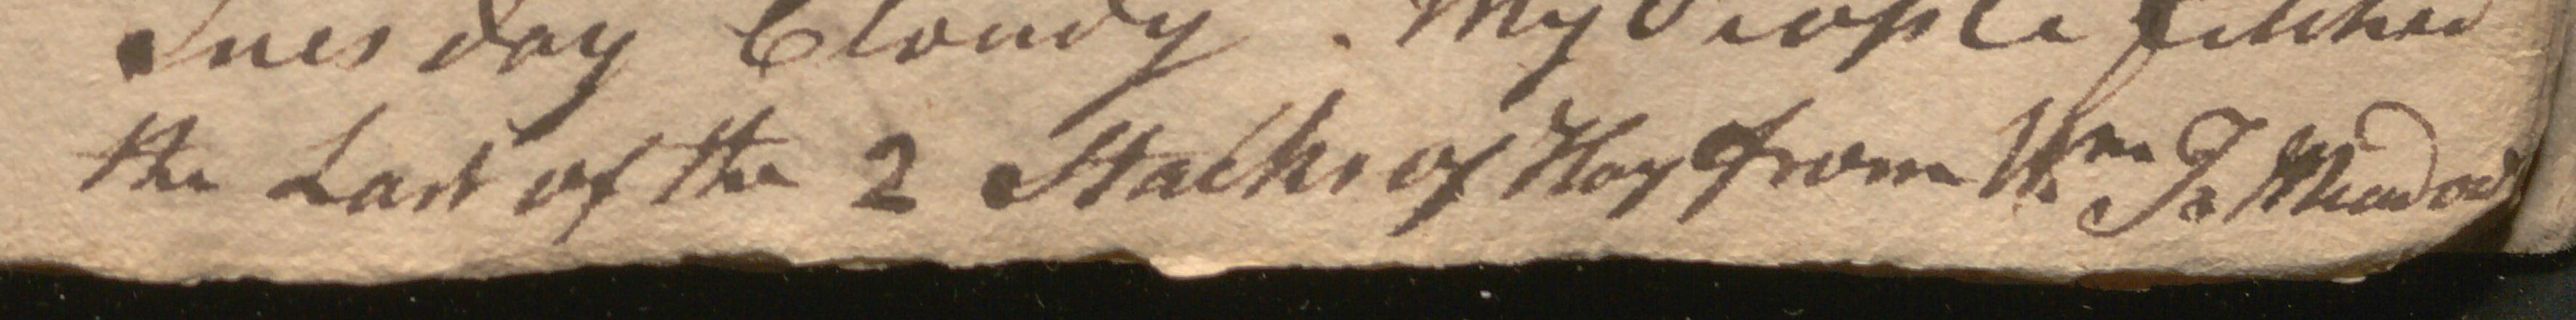the Last of the 2 Stacks of Hay from W^m. J. Meadow
